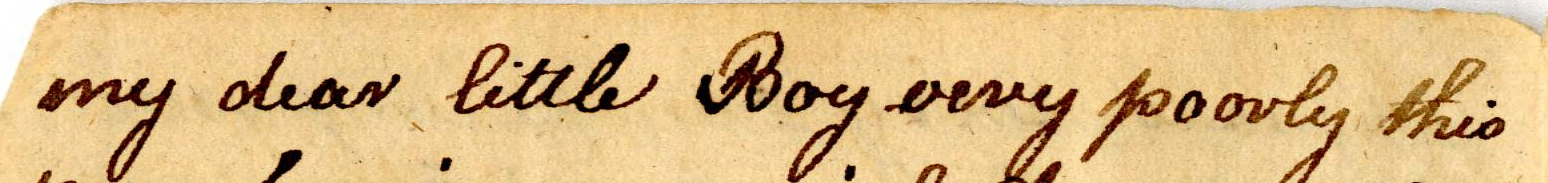my dear little Boy every poorly this
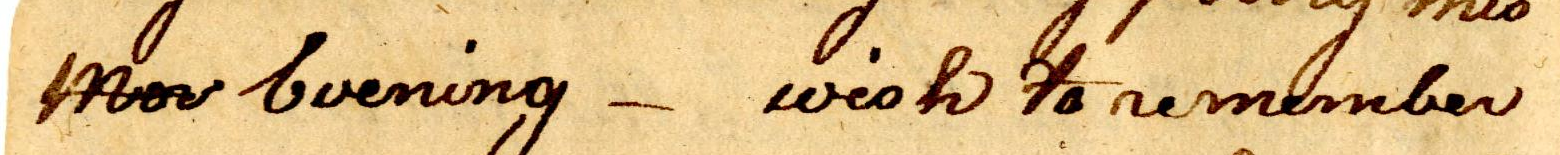[Mor] Evening- wish to remember
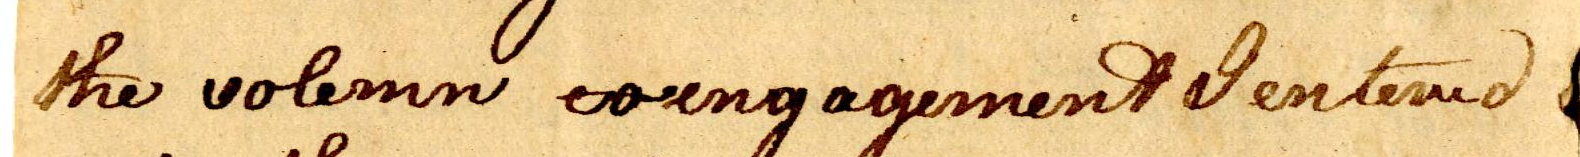the solemn [ev] engagement I entered
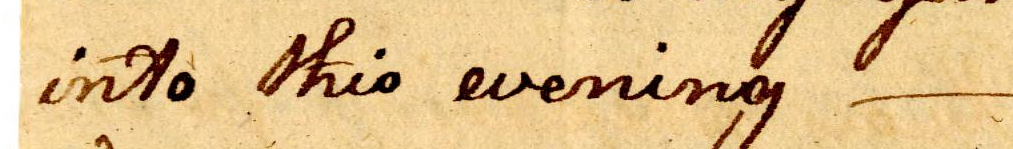into this evening
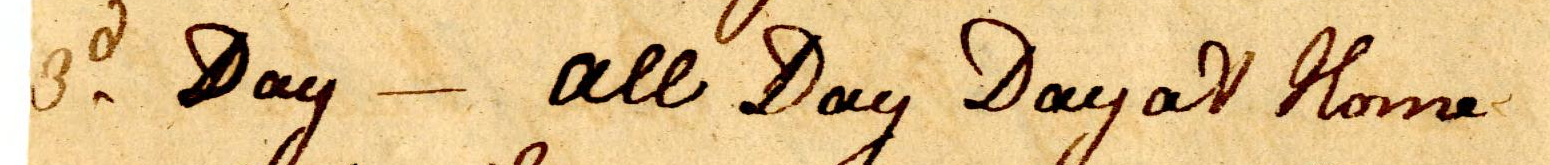3^d. Day- all Day Day at Home
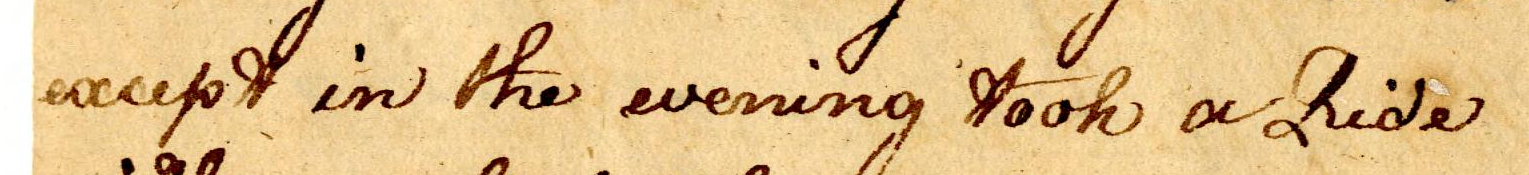except in the evening took a Ride
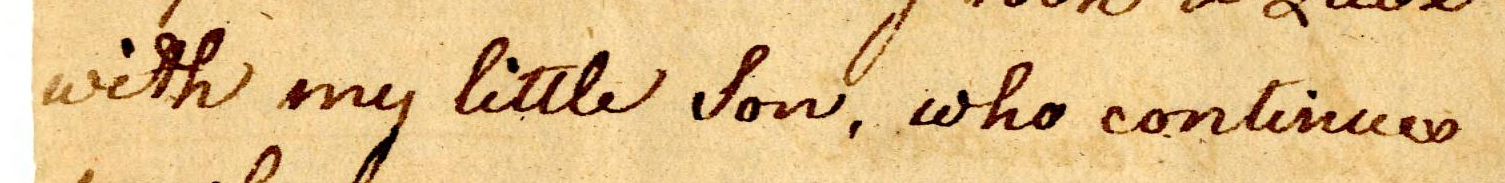with my little Son, who continues
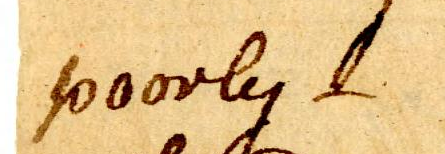poorly-
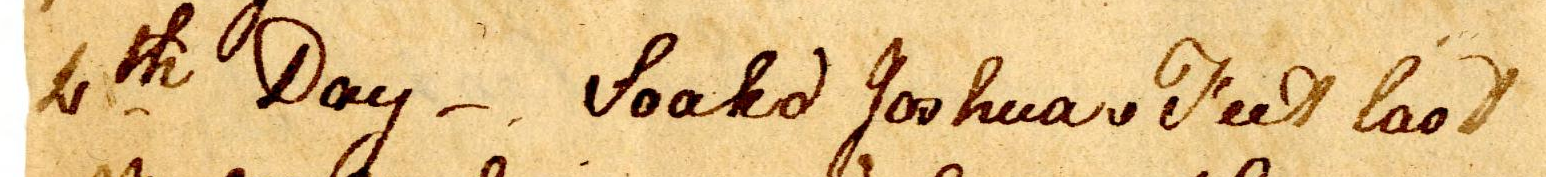4^th Day- Soakd Joshuas Feet last
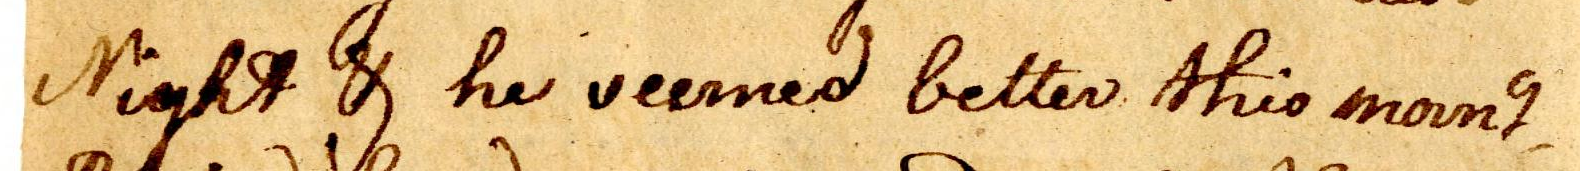Night & he seemed better this morn^g
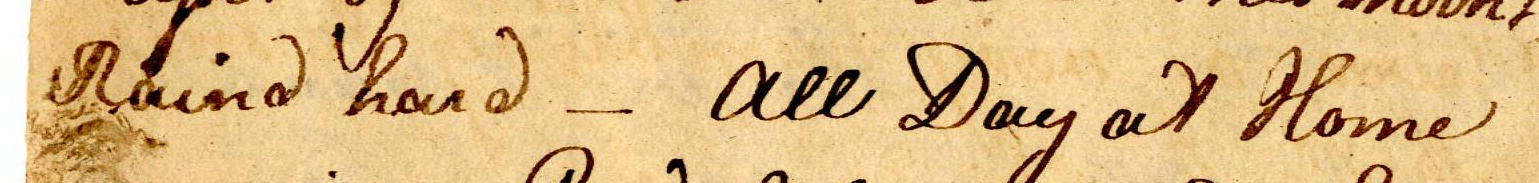Raind hard- All Day at Home
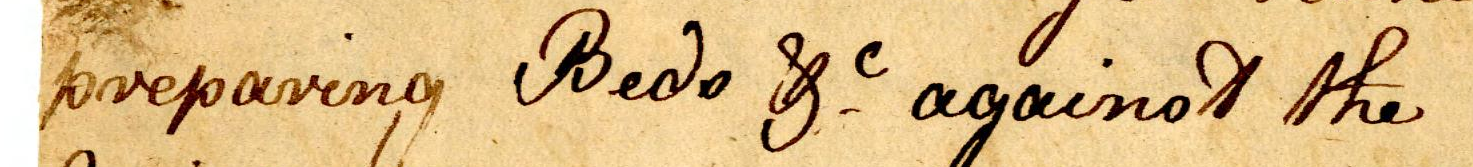preparing Beds &^c against the
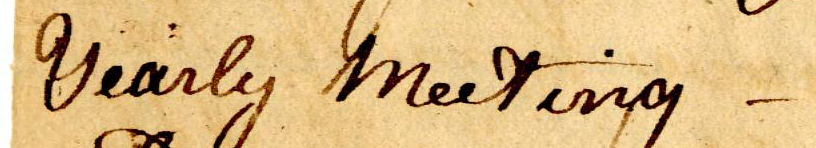Yearly Meeting-
